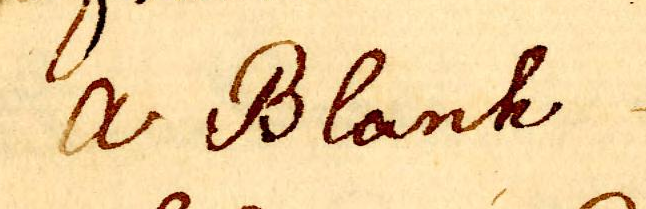A Blank
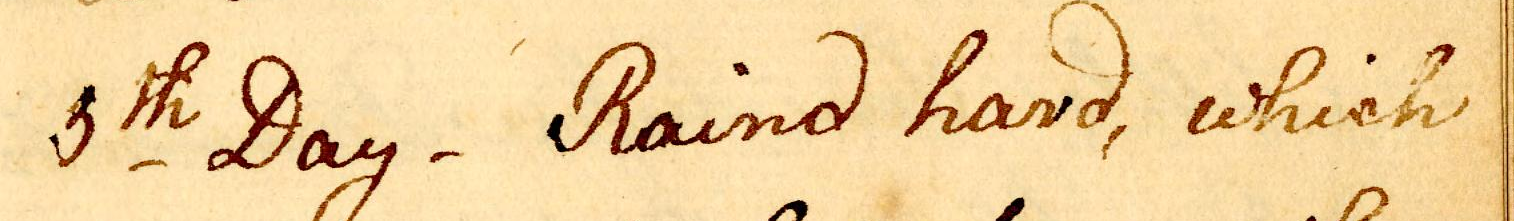5^th Day- Raind hard, which
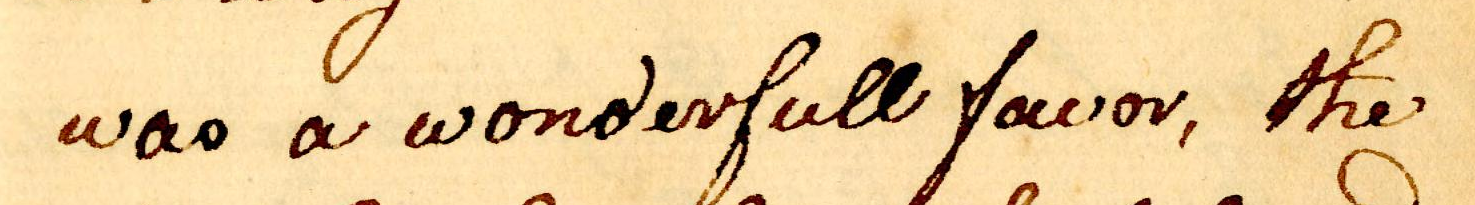was a wonderfull favor, the
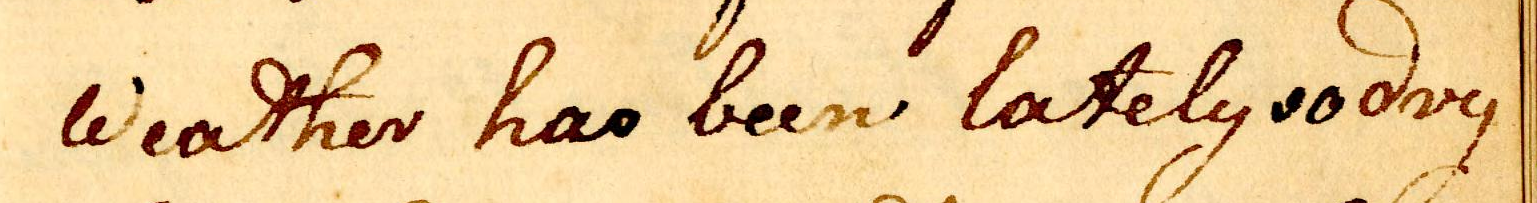Weather has been lately so dry
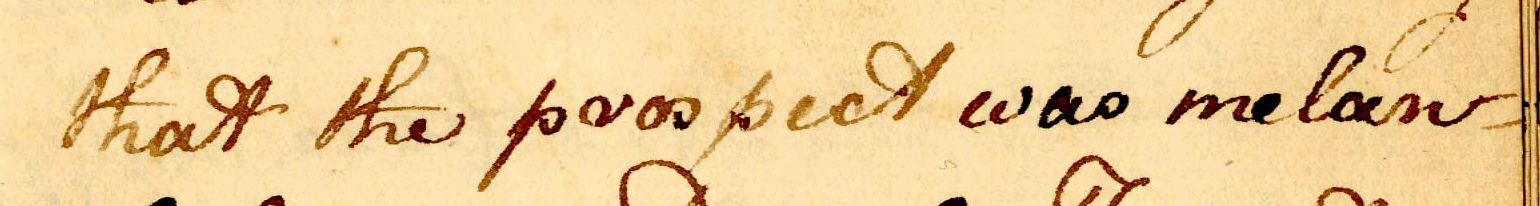that the prospect was melan-
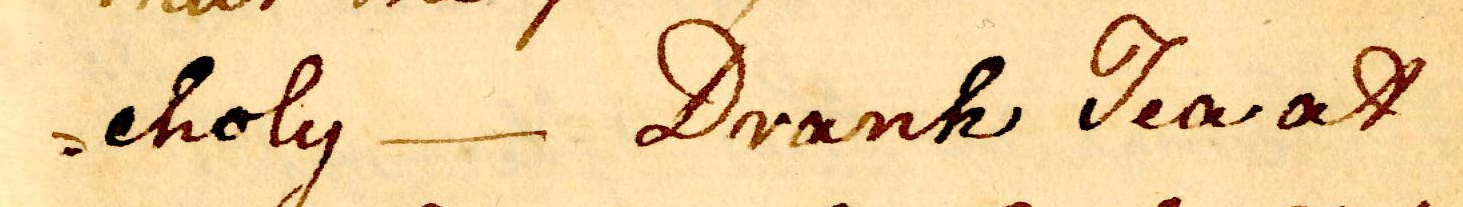-choly- Drank Tea at
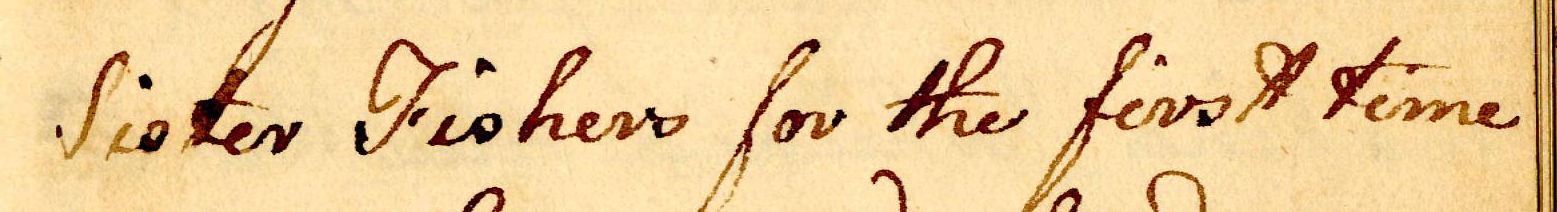Sister Fishers for the first time
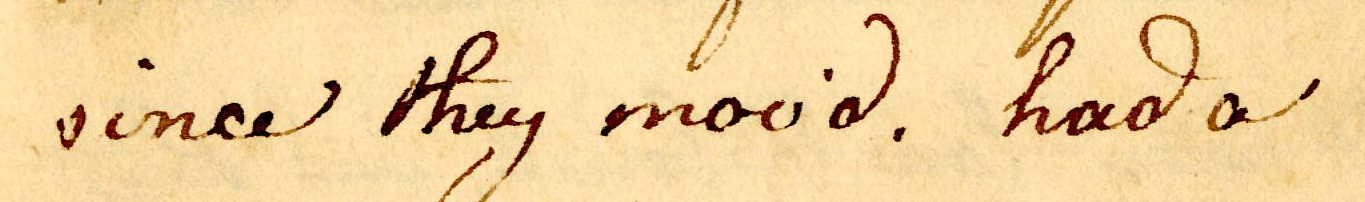since they mov'd. had a
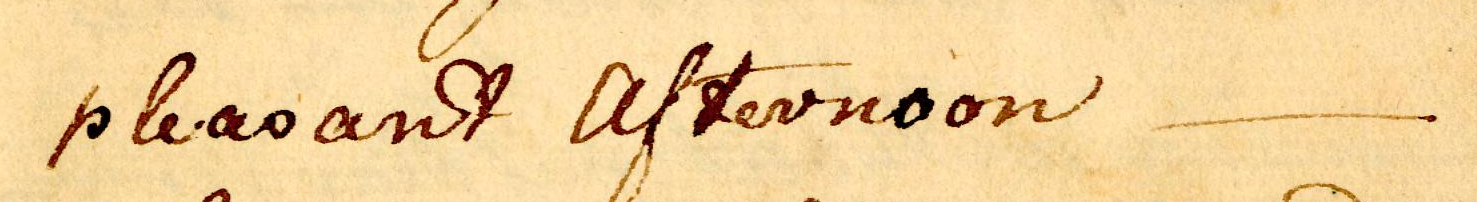pleasant Afternoon-
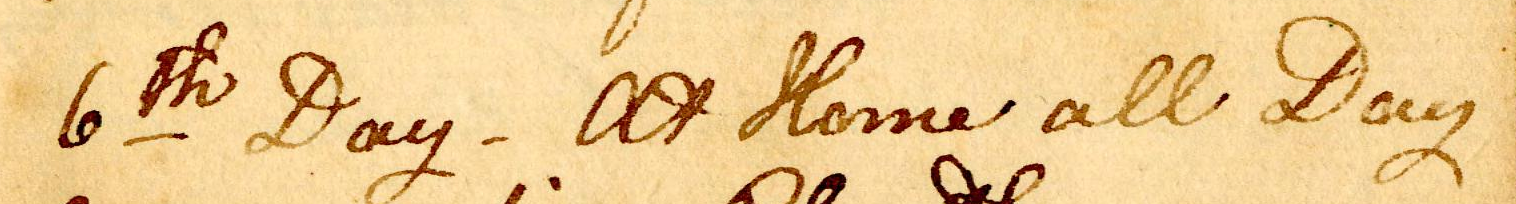6^th Day- At Home all Day
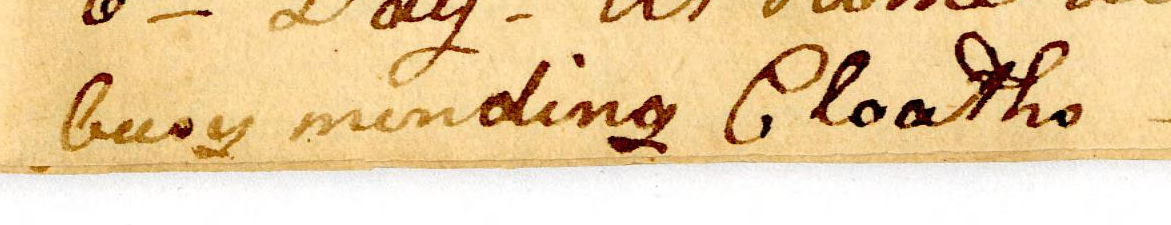busy mending Cloaths
